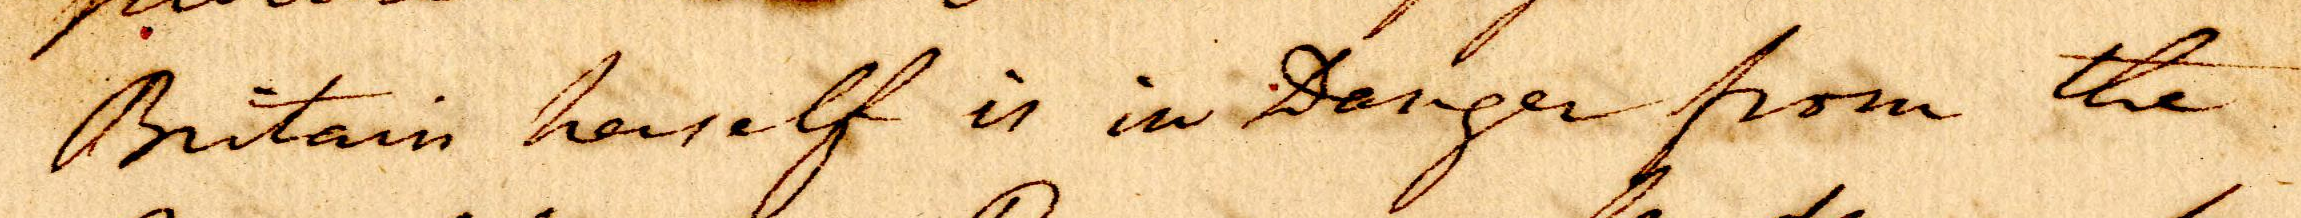Britain herself is in Danger from the
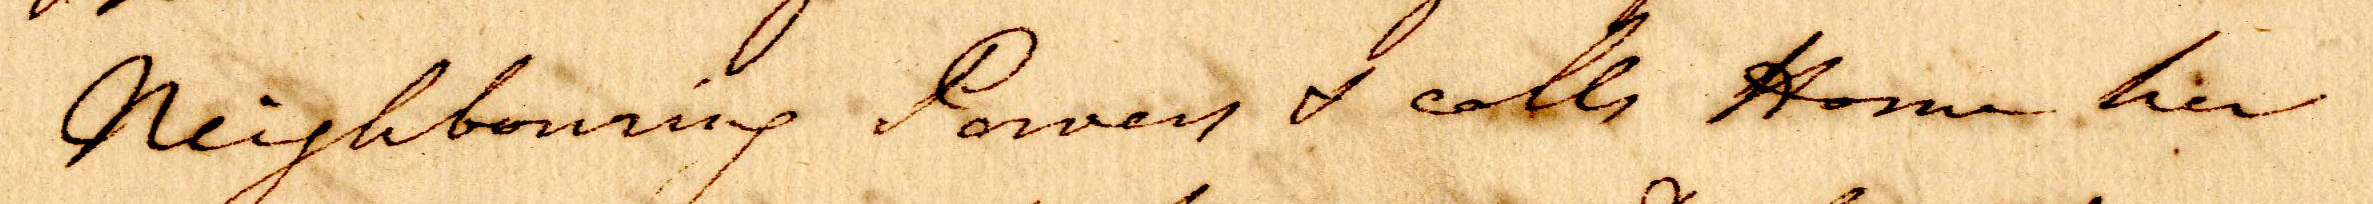Neighbouring Powers & calls Home her
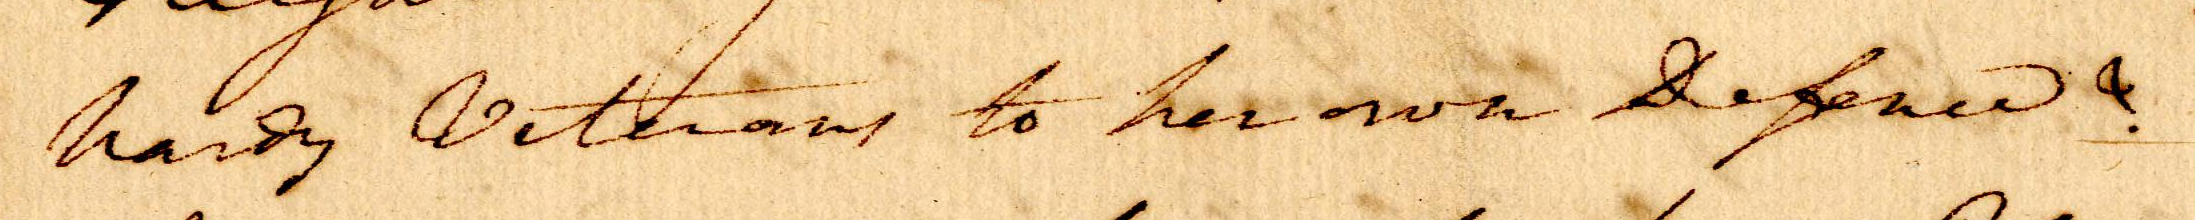hardy Veterans to her own Defence ?
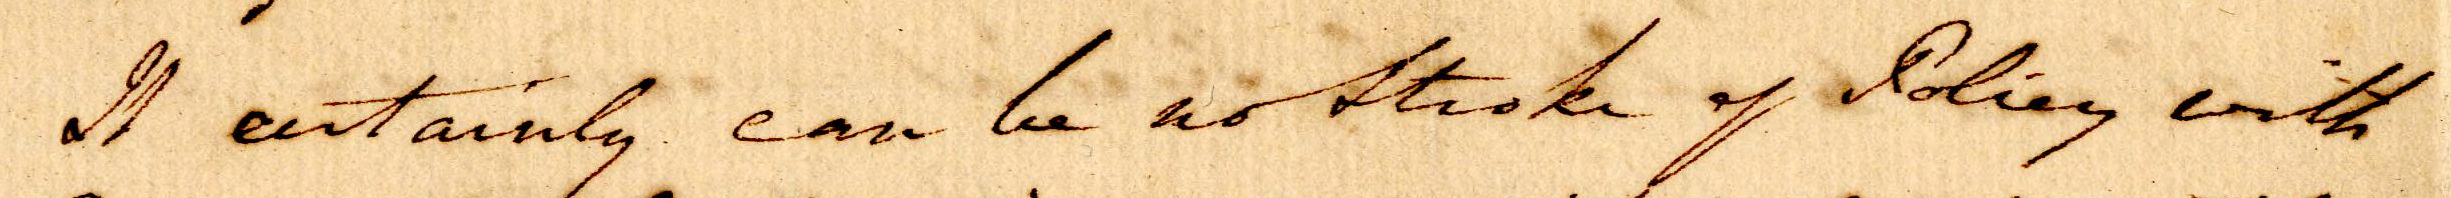It certainly can be no Stroke of Policy with
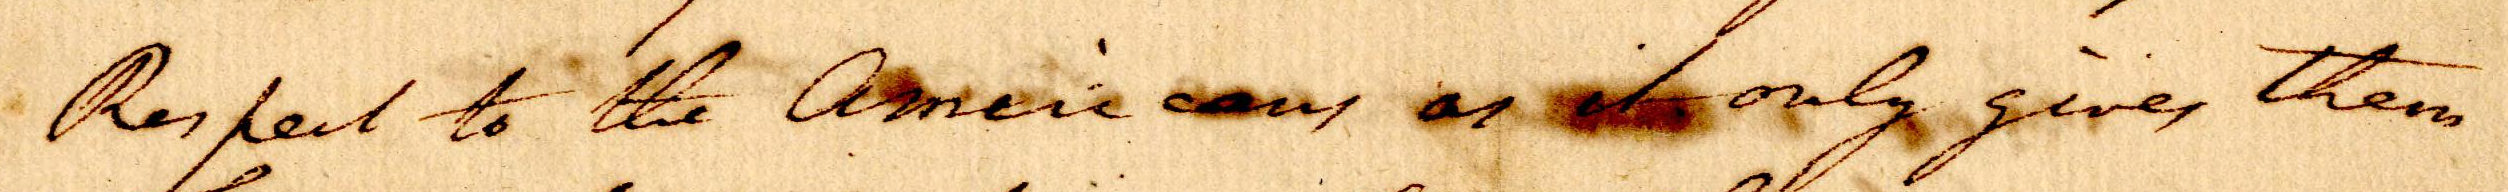Respect to the Americans as it only gives them
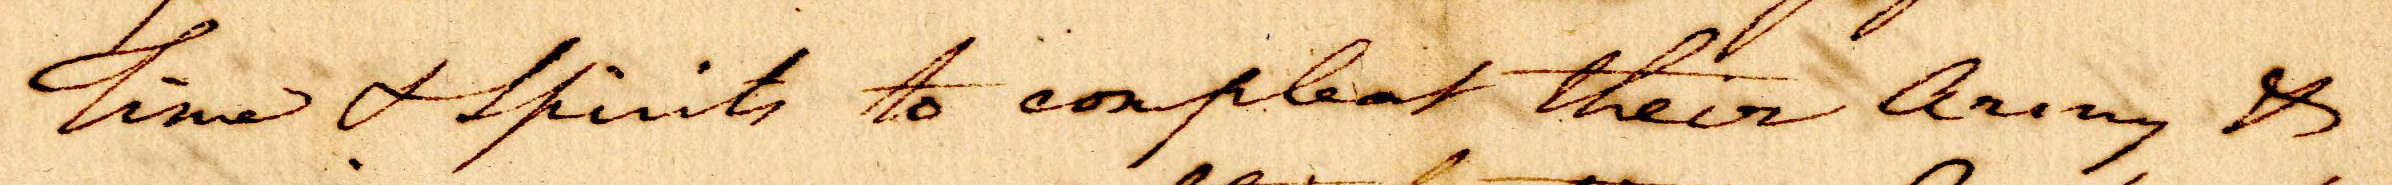Time & spirits to compleat their Army &
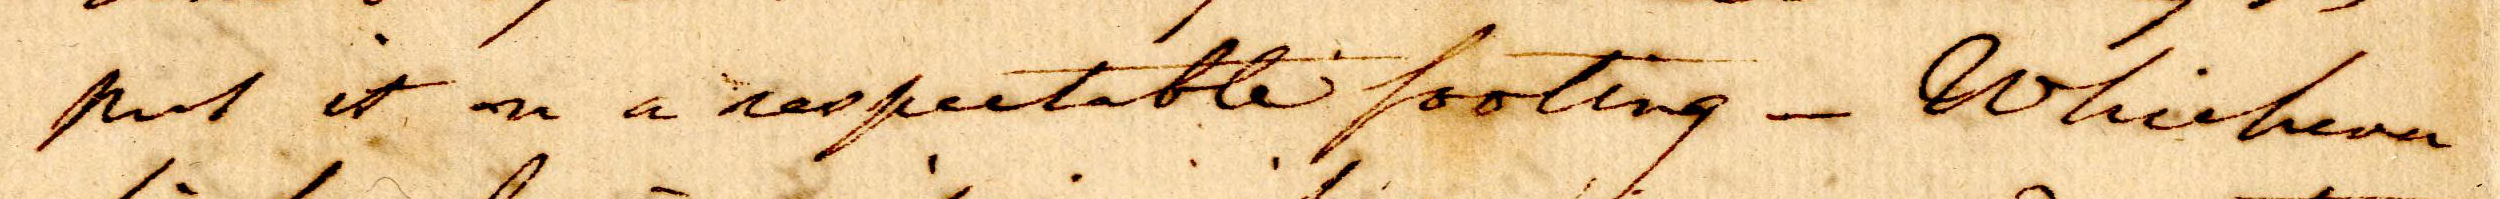put it in a respectable footing- Whichever
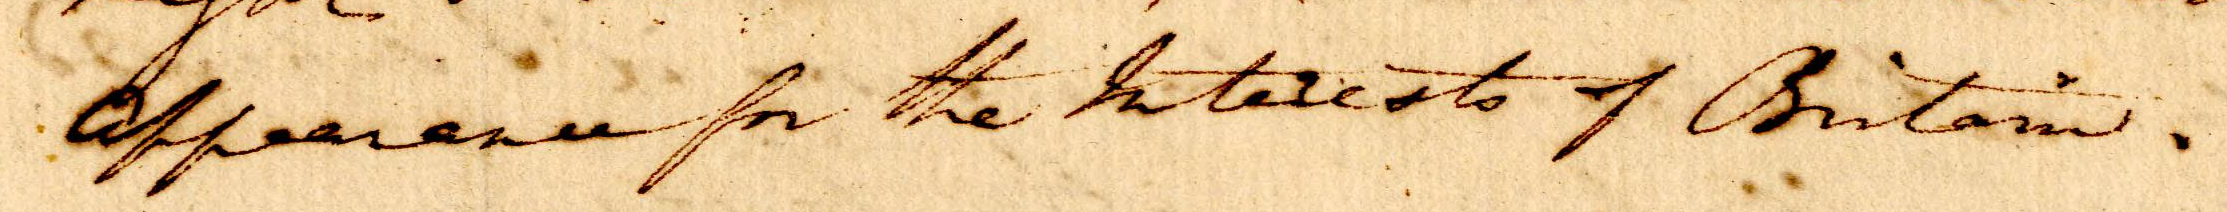Appearance for the Interests of Britain.
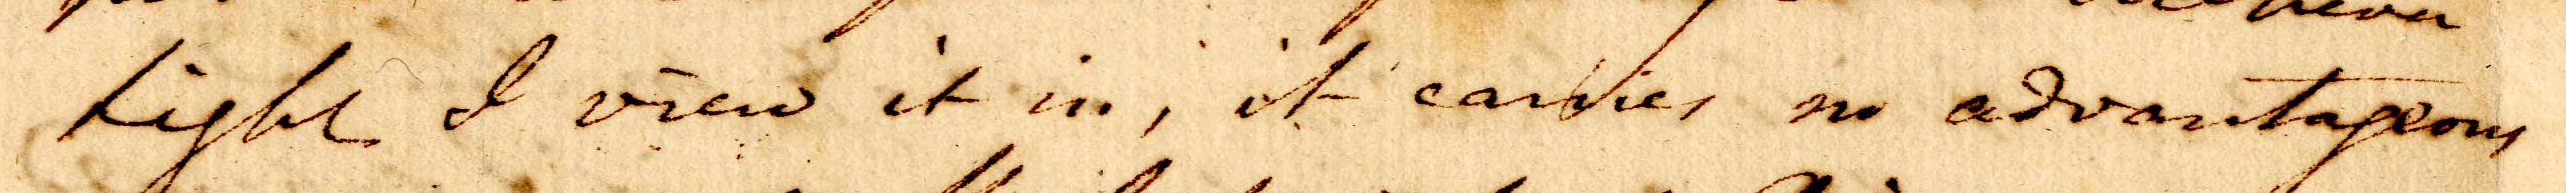Light I view it in, it carries no advantageous
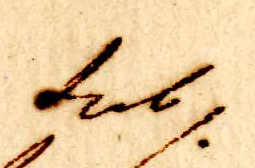Sub.
